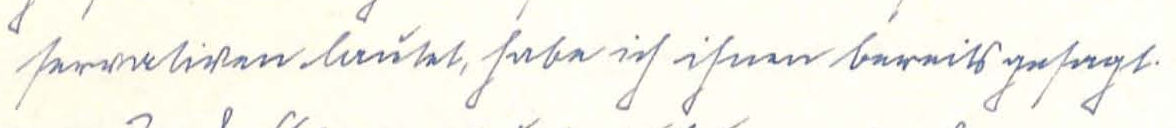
servativen lautet, habe ich ihnen bereits gesagt.
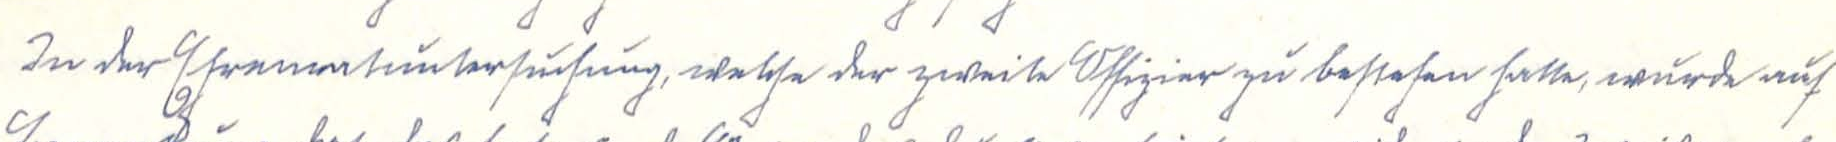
In der Ehrenratuntersuchung, welche der zweite Offizier zu bestehen hatte, wurde auf
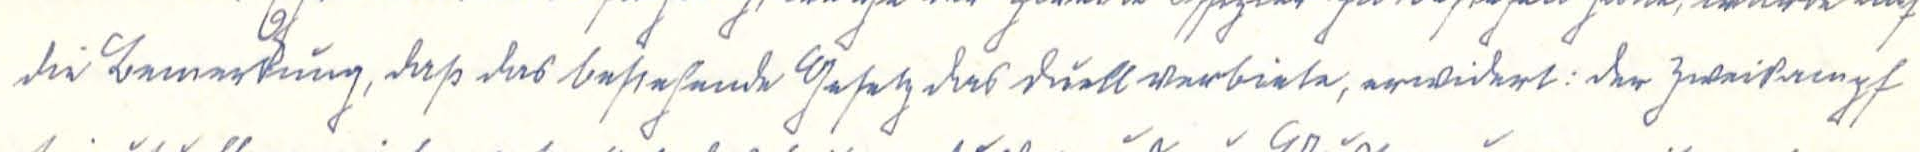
die Bemerkung, daß das bestehende Gesetz das Duell verbiete, erwidert: Der Zweikampf
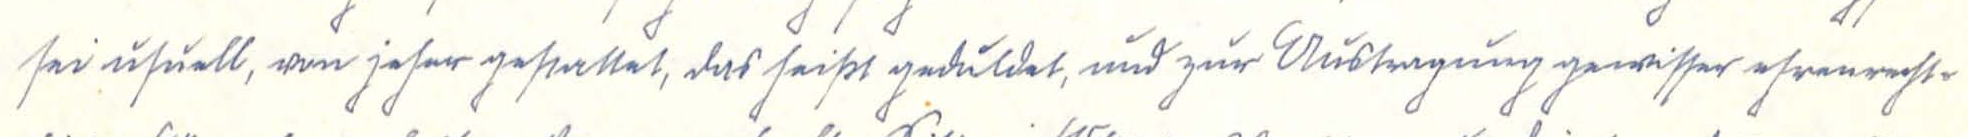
sei usuell, von jeher gestattet, das heißt geduldet, und zur Austragung gewisser ehrenrecht-
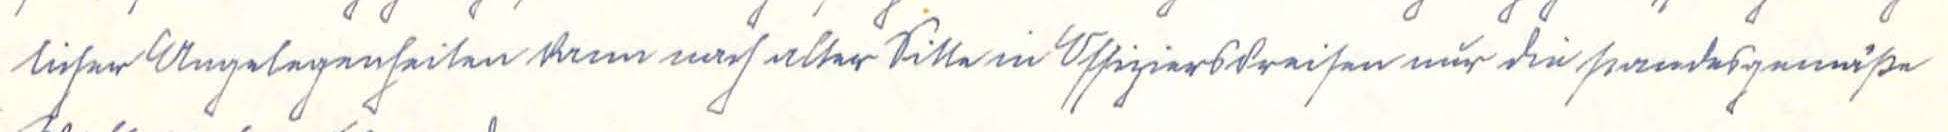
licher Angelegenheiten kann nach alter Sitte in Offizierskreisen nur die standesgemäße
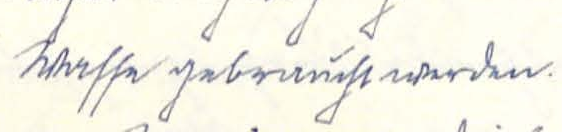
Waffe gebraucht werden.
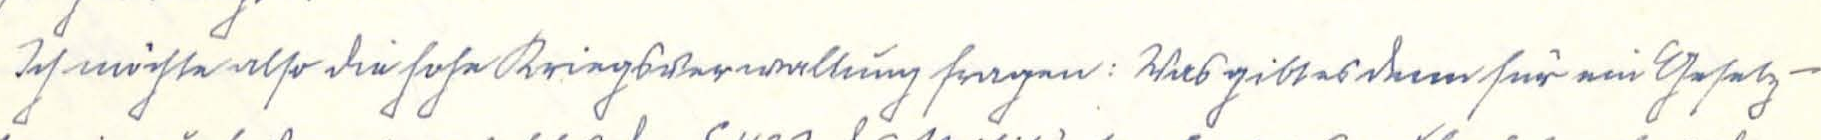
Ich möchte also die hohe Kriegsverwaltung fragen: Was gibt es denn für ein Gesetz -
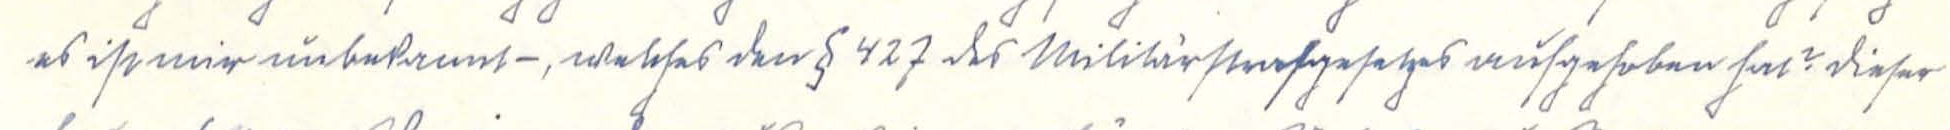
es ist mir unbekannt -, welches den §427 des Militärstrafgesetzes aufgehoben hat? Dieser
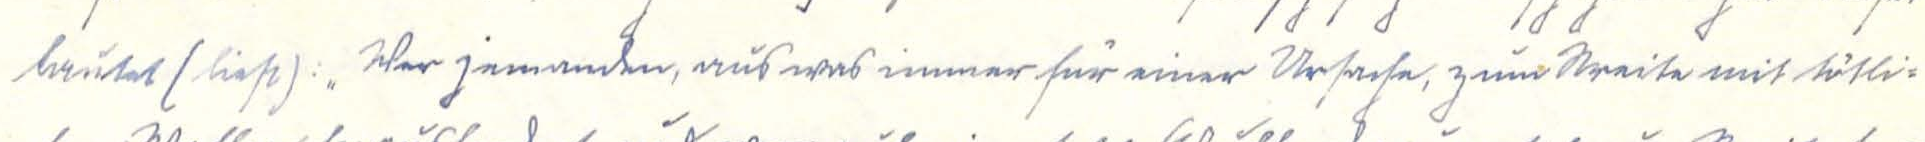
lautet (liest): „Wer jemanden, aus was immer für einer Ursache, zum Streite mit tödli-
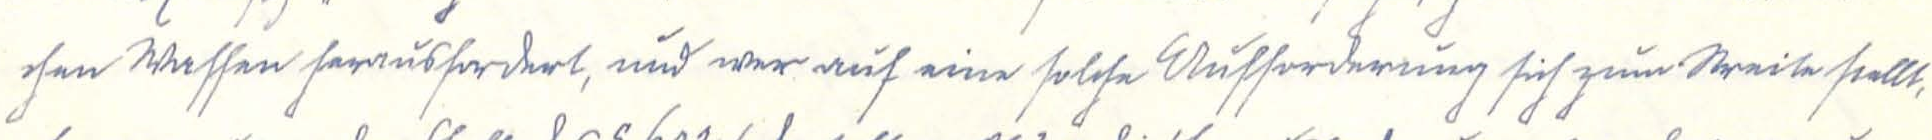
chen Waffen herausfordert, und wer auf eine solche Aufforderung sich zum Streite stellt,
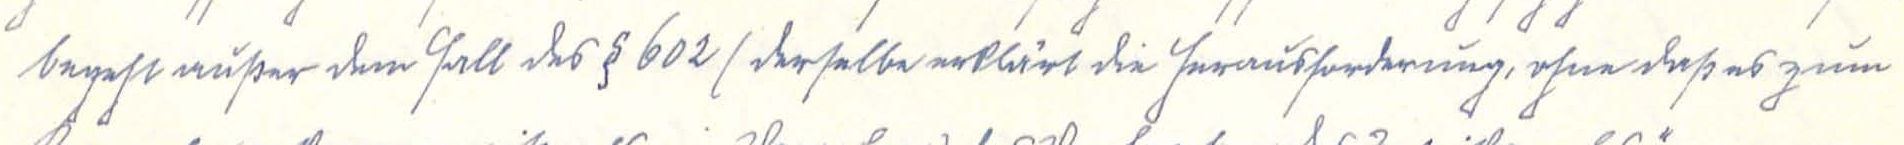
begeht außer dem Fall des §602 (Derselbe erklärt die Herausforderung, ohne daß es zum
